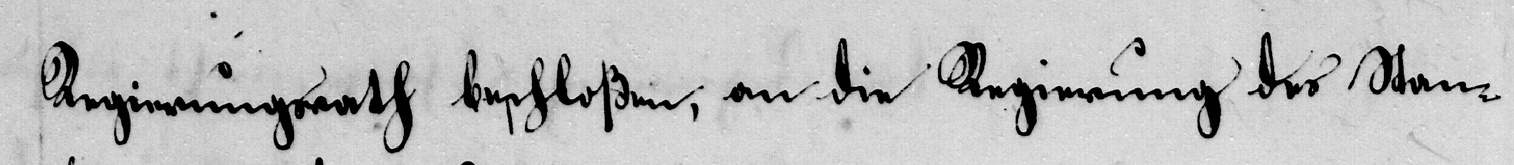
Regierungsrath beschloßen, an die Regierung des Stan¬
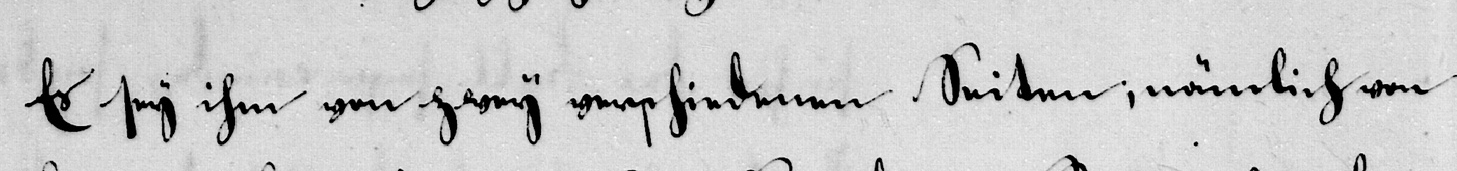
Es sey ihm von zwey verschiedenen Seiten, nämlich von
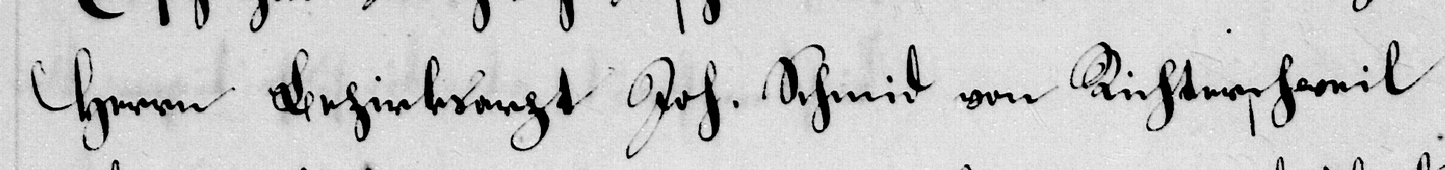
Herrn Bezirksarzt Joh. Schmid von Richterschweil
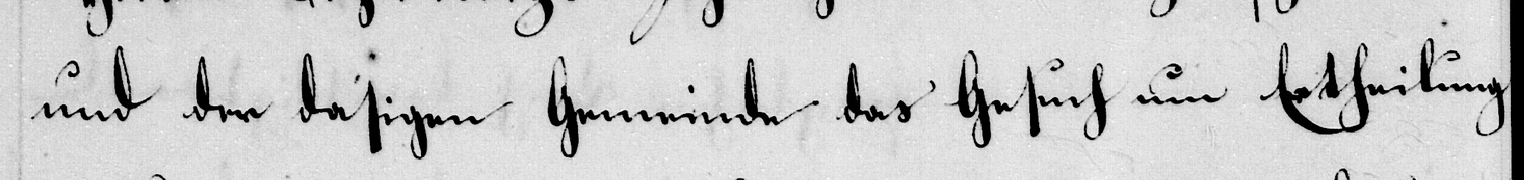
und der dasigen Gemeinde das Gesuch um Ertheilung
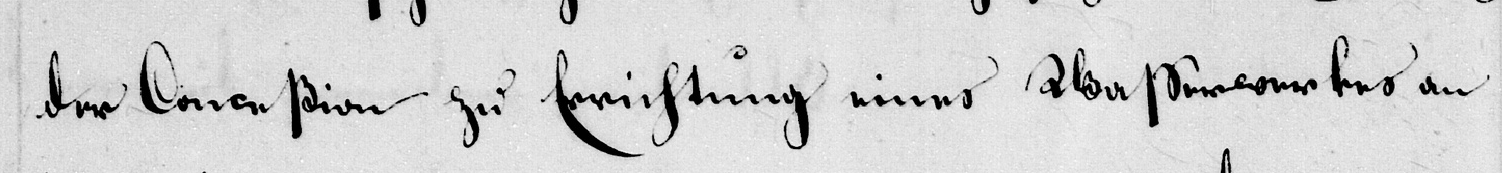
der Conceßion zu Errichtung eines Waßerwerkes an
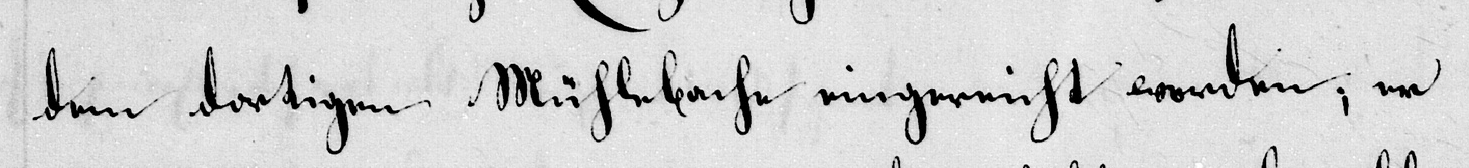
dem dortigen Mühlebache eingereicht worden; er
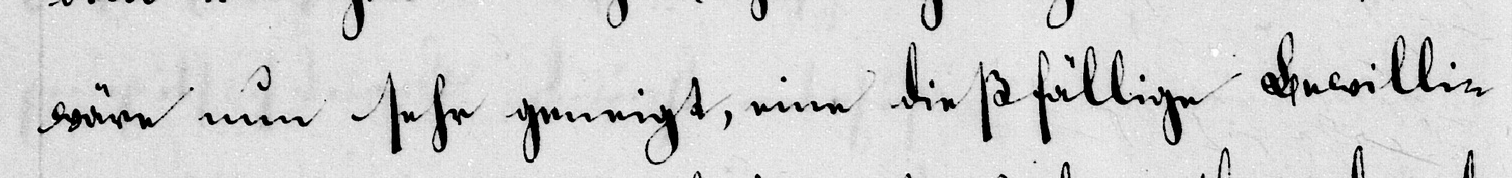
wäre nun sehr geneigt, eine dießfällige Bewilli¬
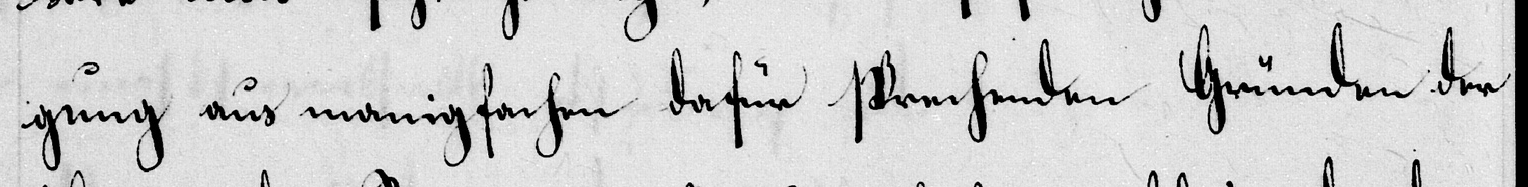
gung aus manigfachen dafür sprechenden Gründen der
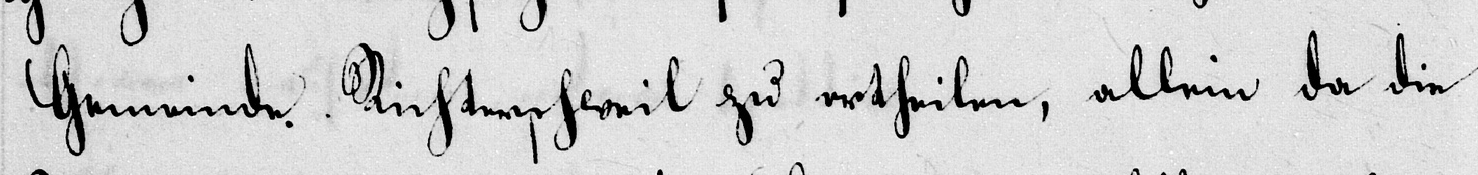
Gemeinde Richterschweil zu ertheilen, allein da die
